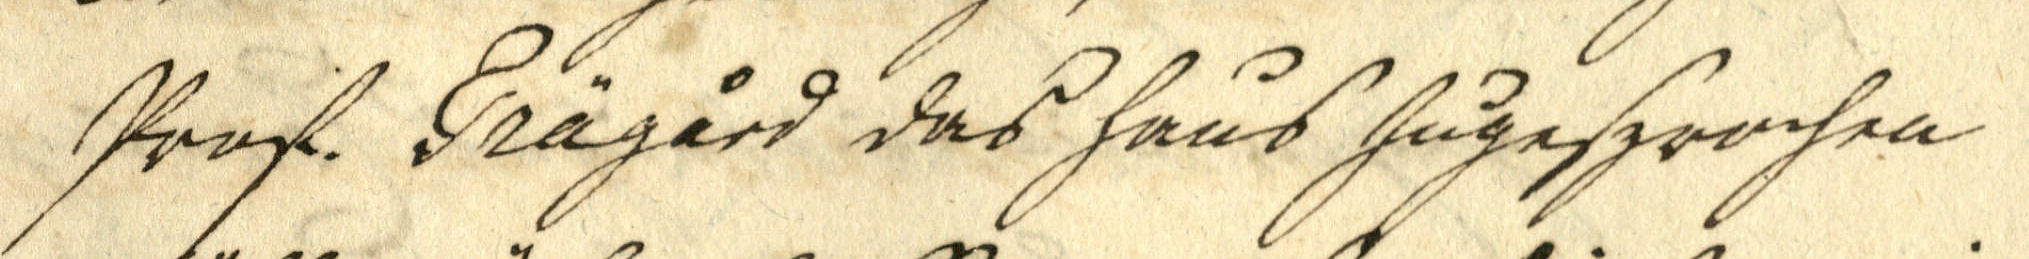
Prof. Trägård das Haus zugesprochen
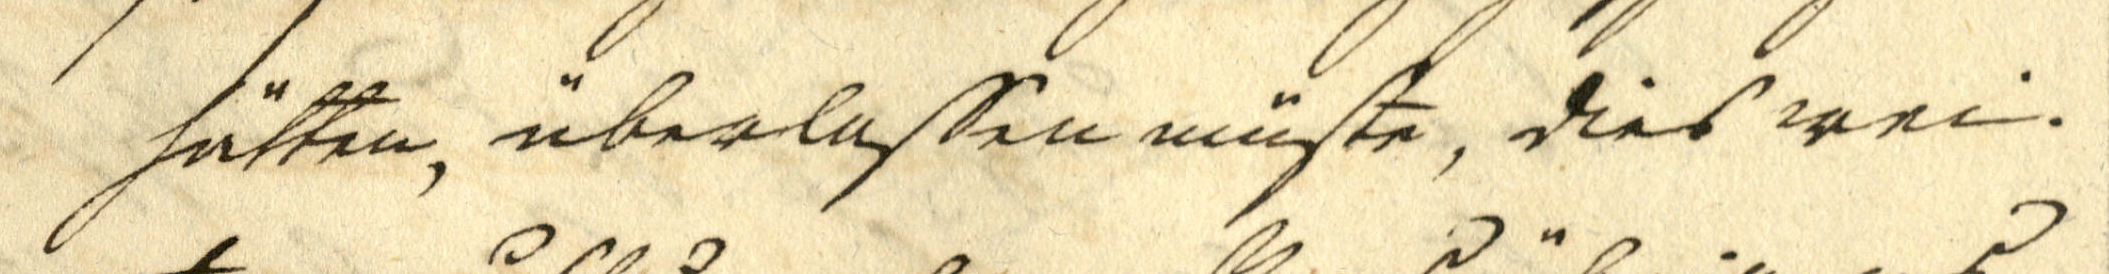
hätten, überlassen müßte, dies wei¬
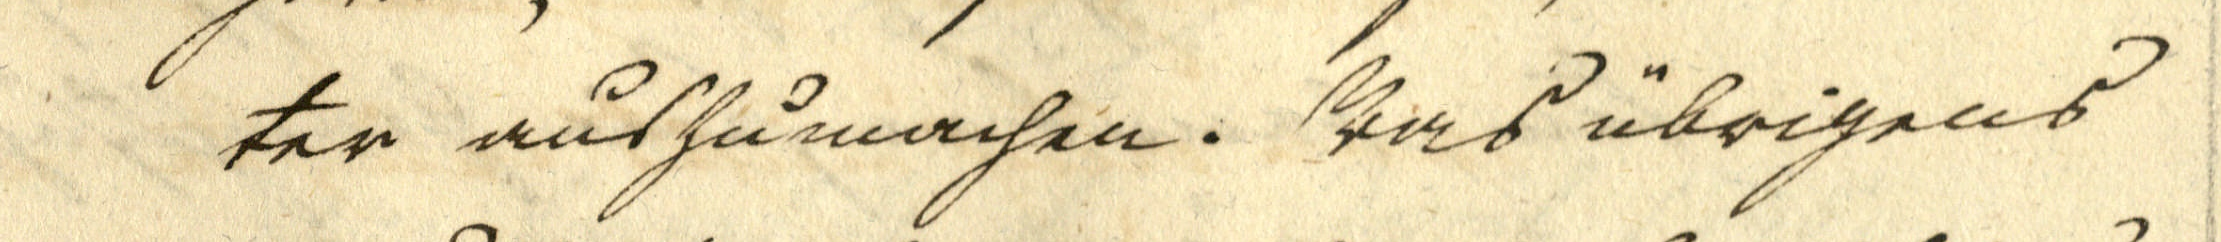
ter auszumachen. Was übrigens
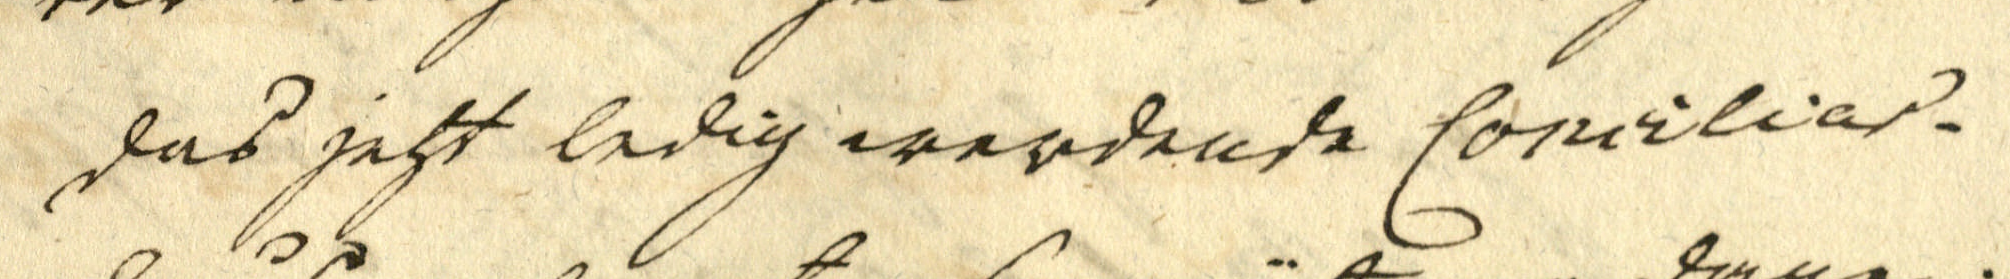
das jetzt ledig werdende Conciliar¬
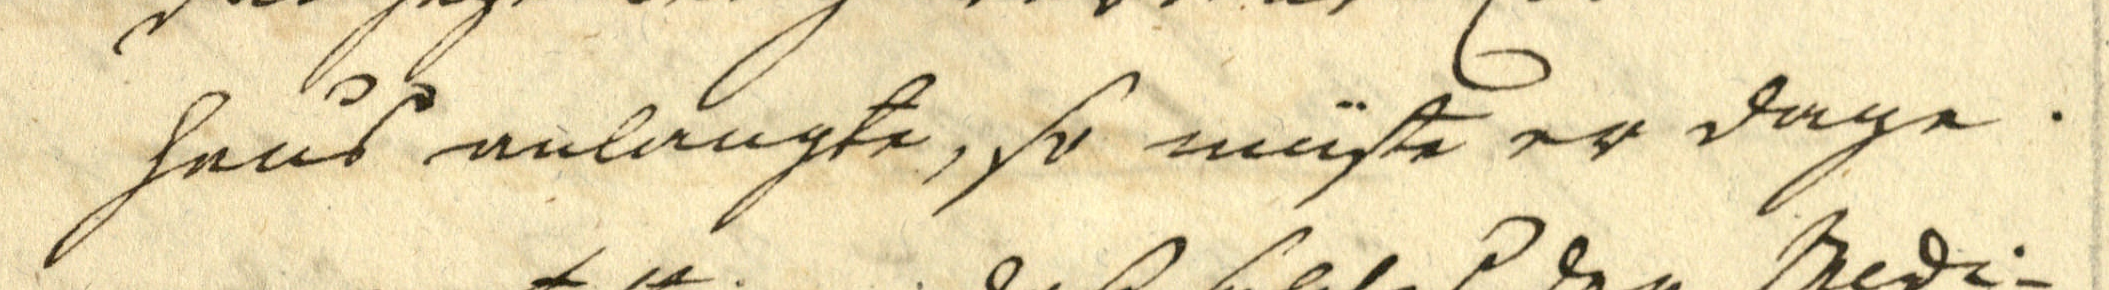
haus anlangte, so müßte er dage¬
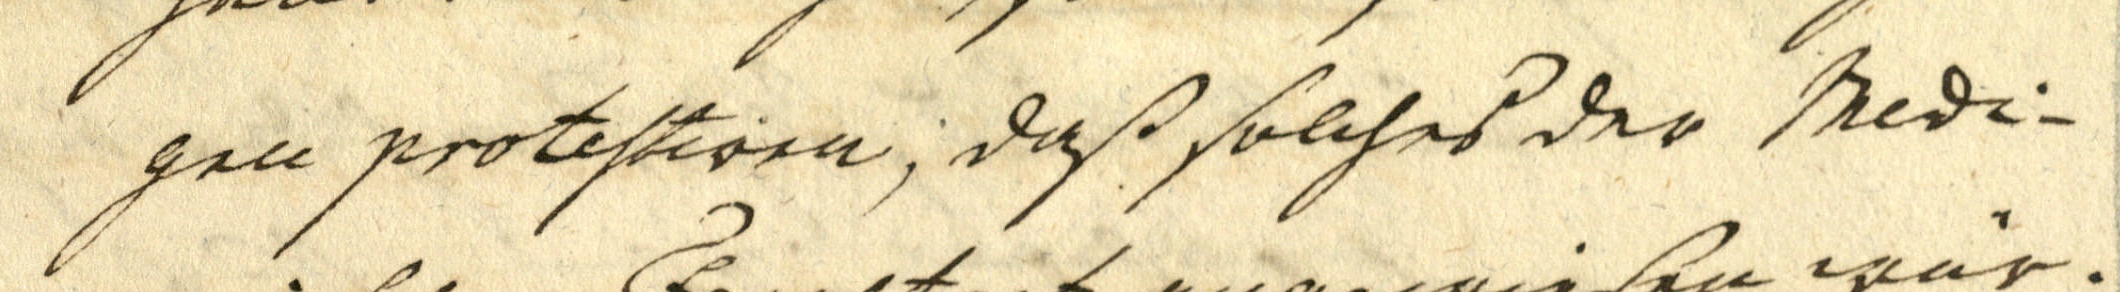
gen protestiren, daß solches der Medi¬
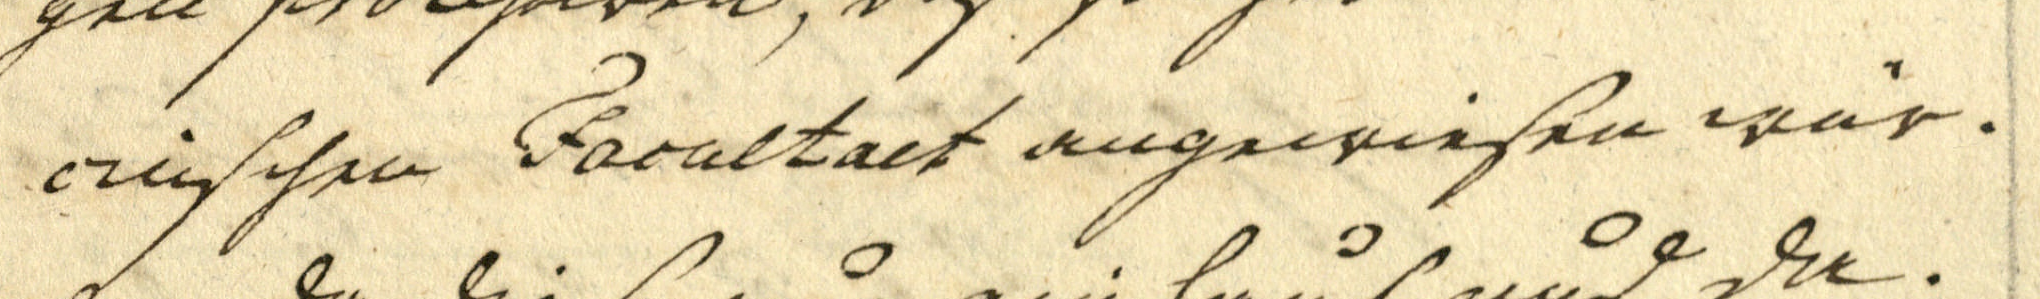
cinischen Facultaet angewiesen wür-
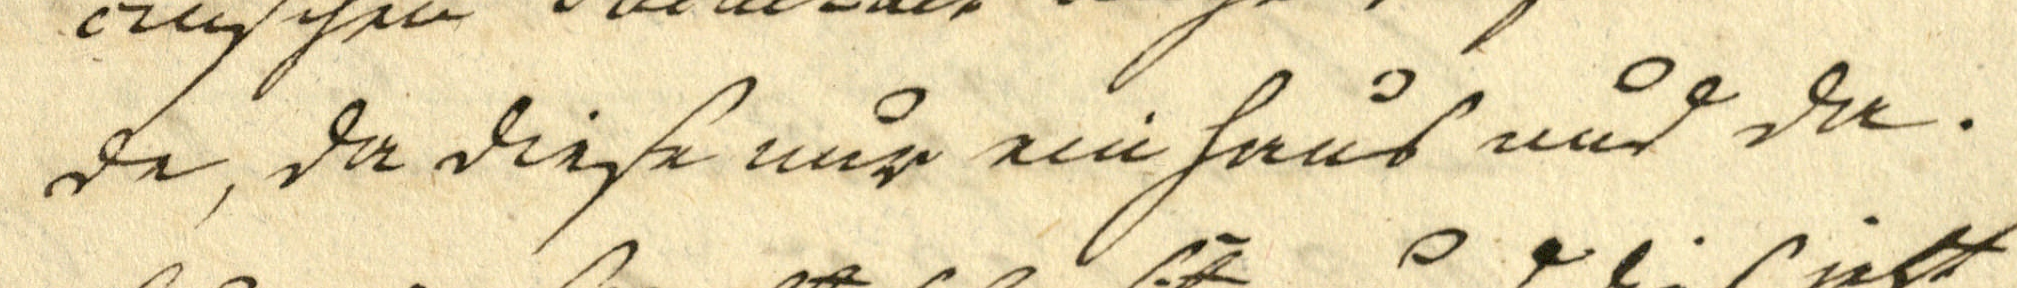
de, da diese nur ein Haus und da¬
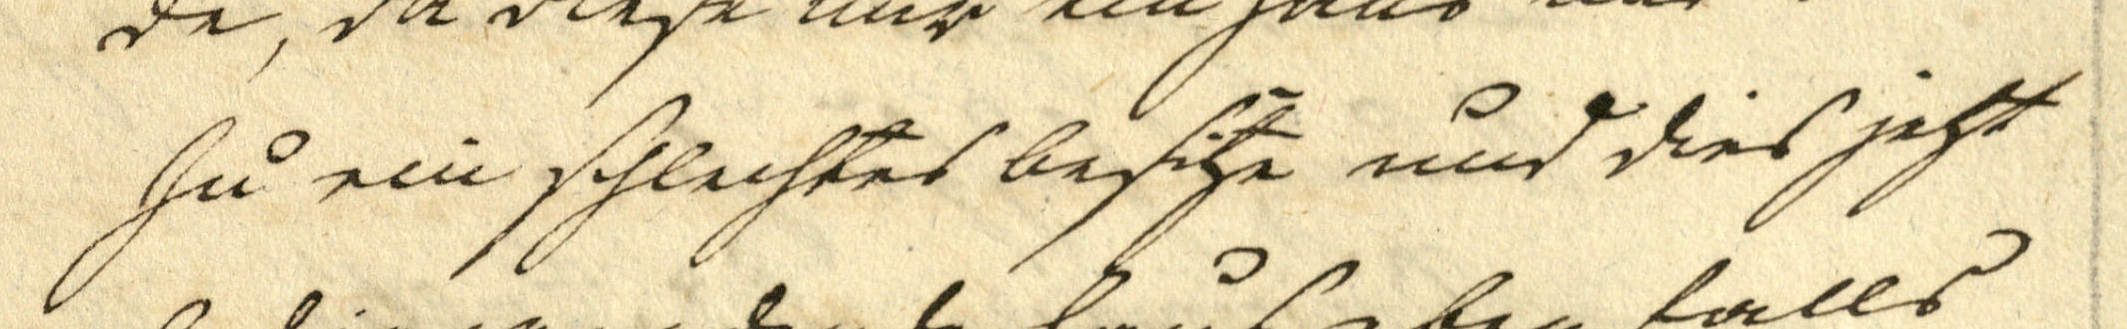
zu ein schlechtes beste und dies jetzt
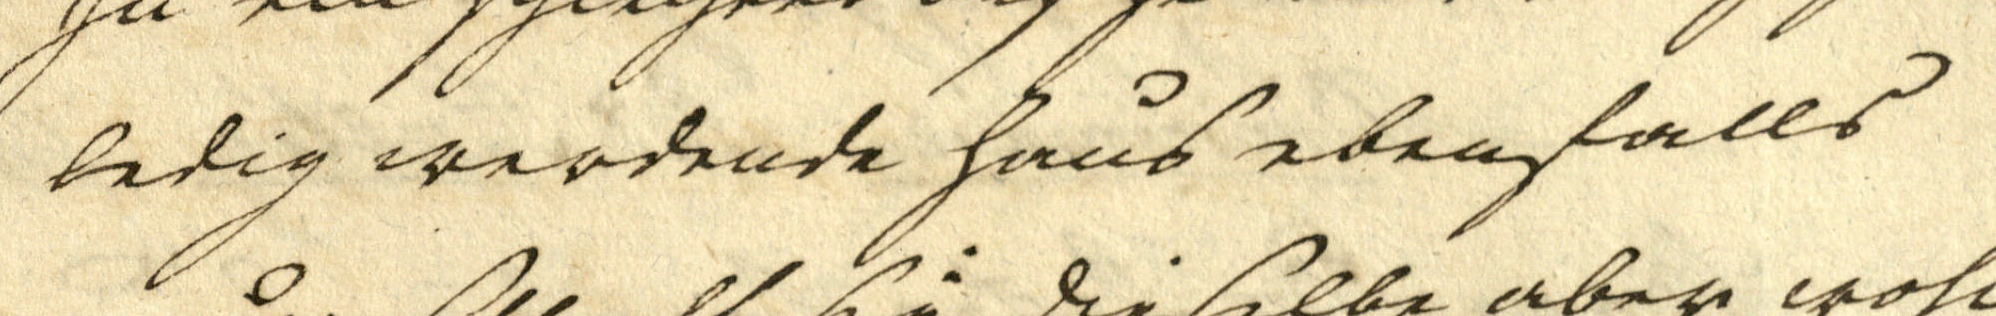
ledig werdende Haus ebenfalls
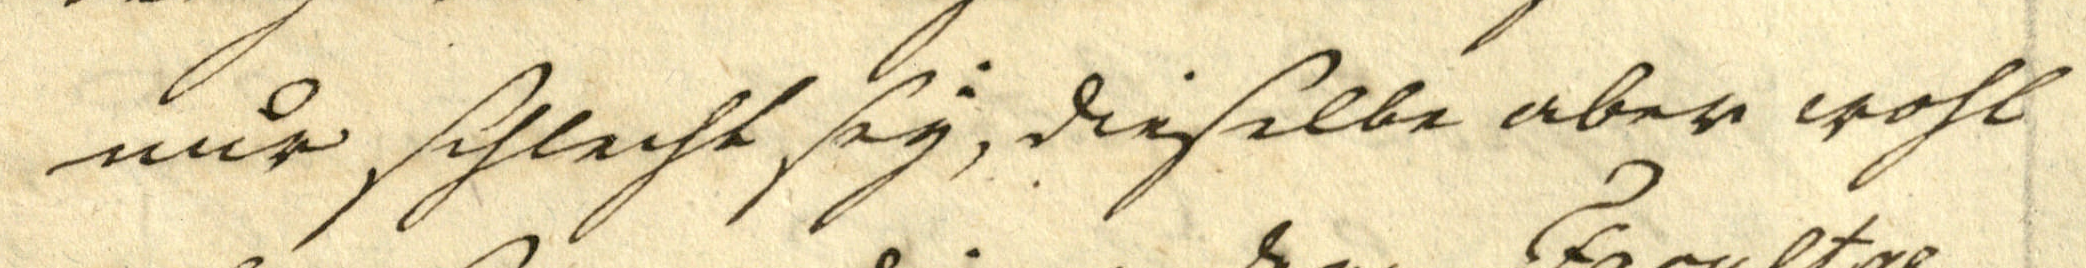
nur schlecht seÿ, dieselbe aber wohl
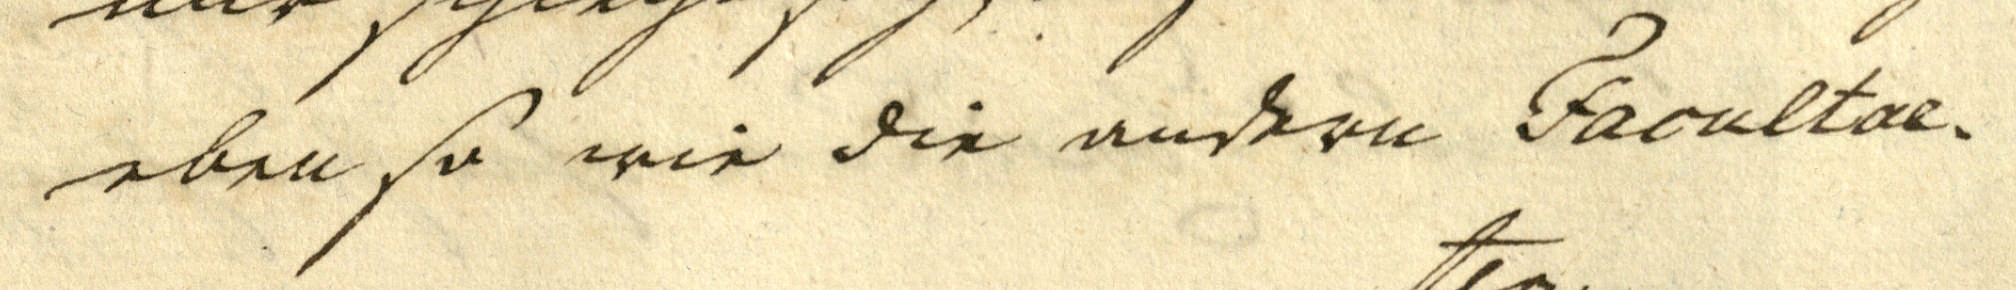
eben so wie die andern Facultae¬
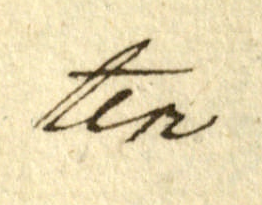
ten
